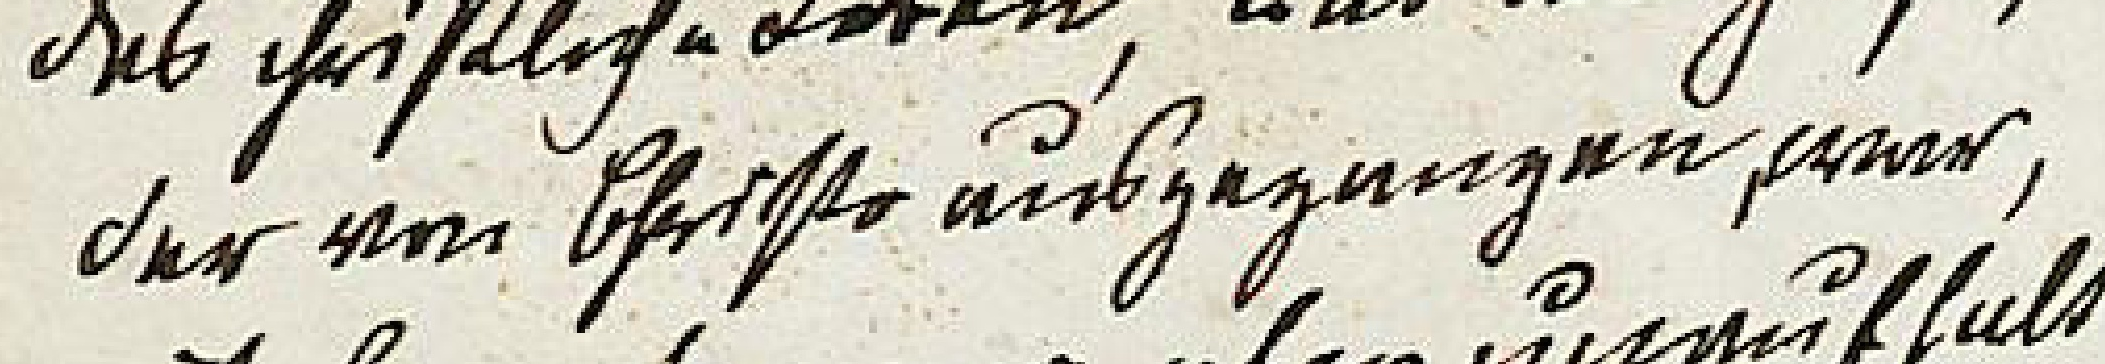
der von Christo ausgegangen, war,
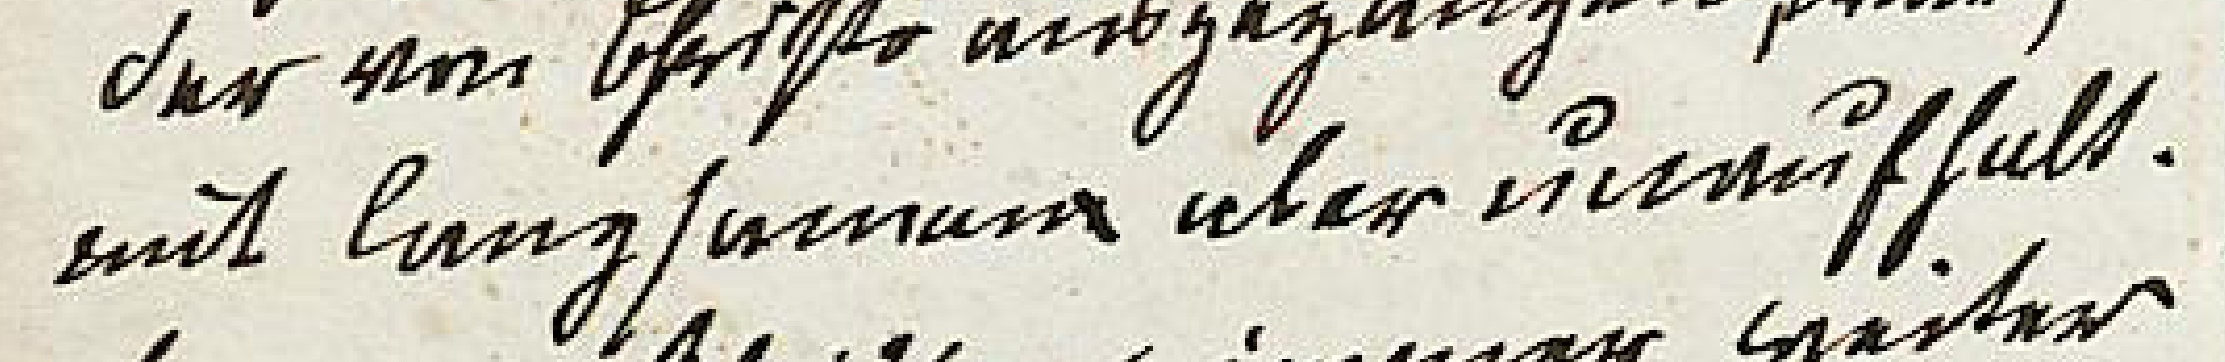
mit langsamen aber unaufhalt¬
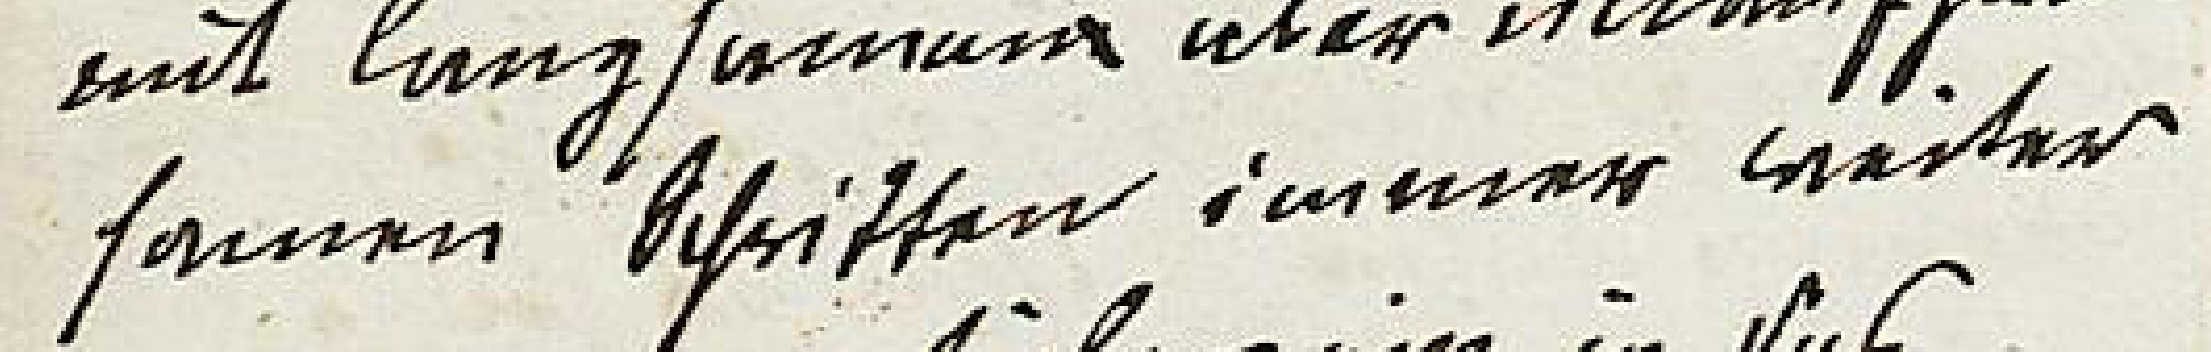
samen Schritten immer weiter
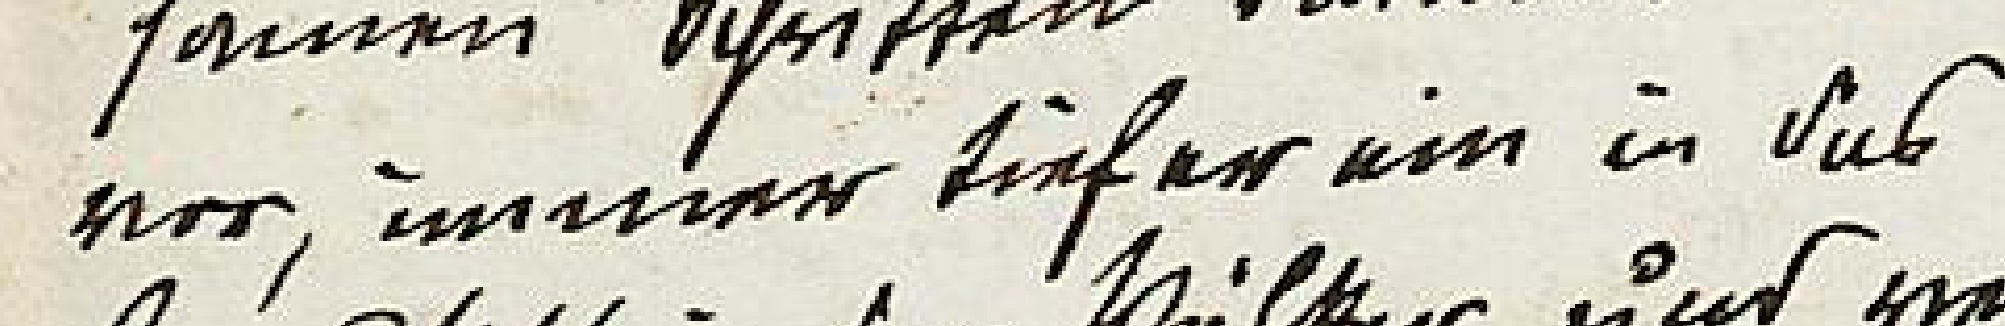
vor, immer tiefer ein in das
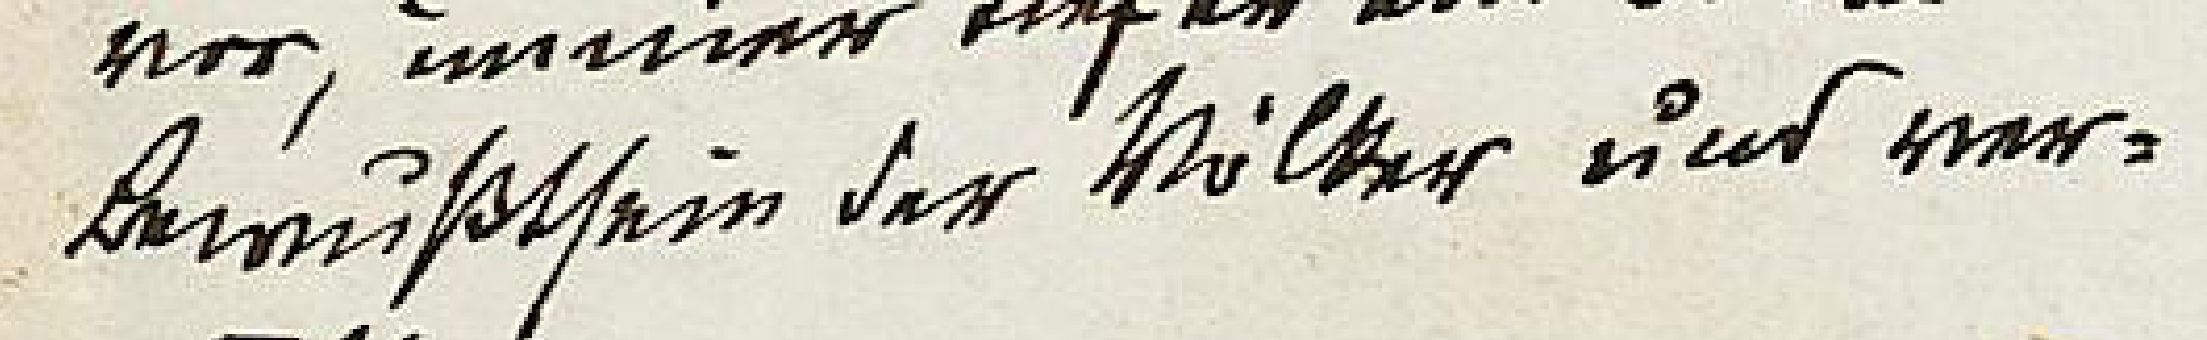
Bewußtsein der Völker und ver¬
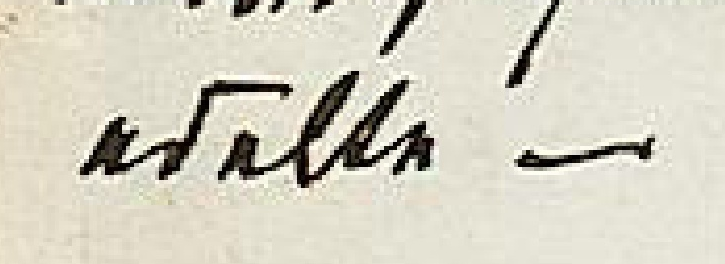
edelte _
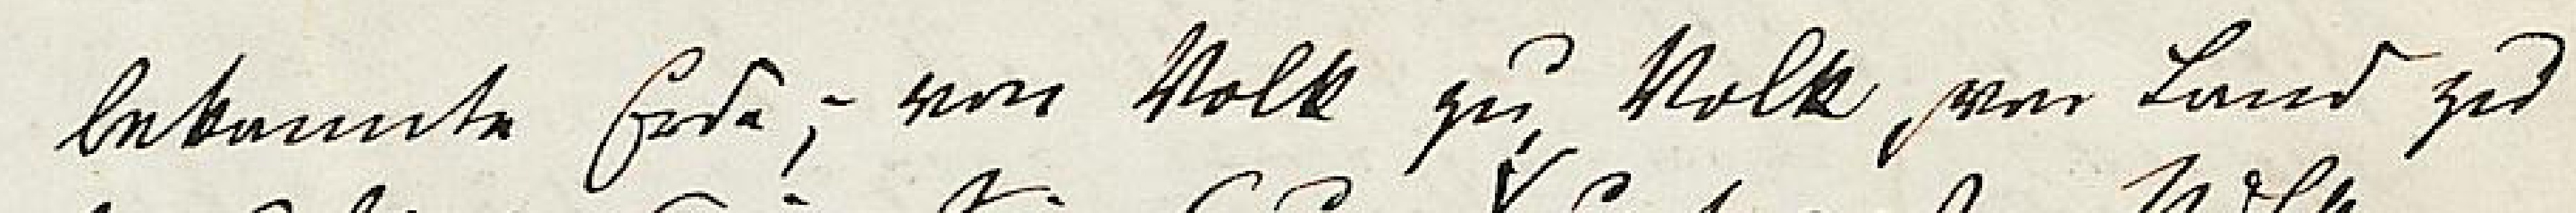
bekannte Erde; von Volk zu Volk, von Land zu
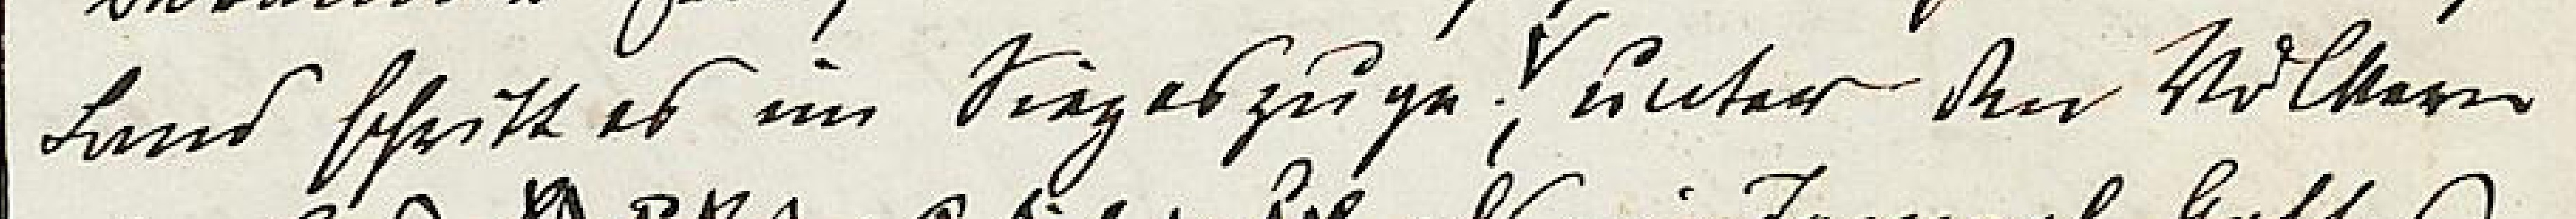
Land schritt es im Siegeszuge, V unter den Völkern
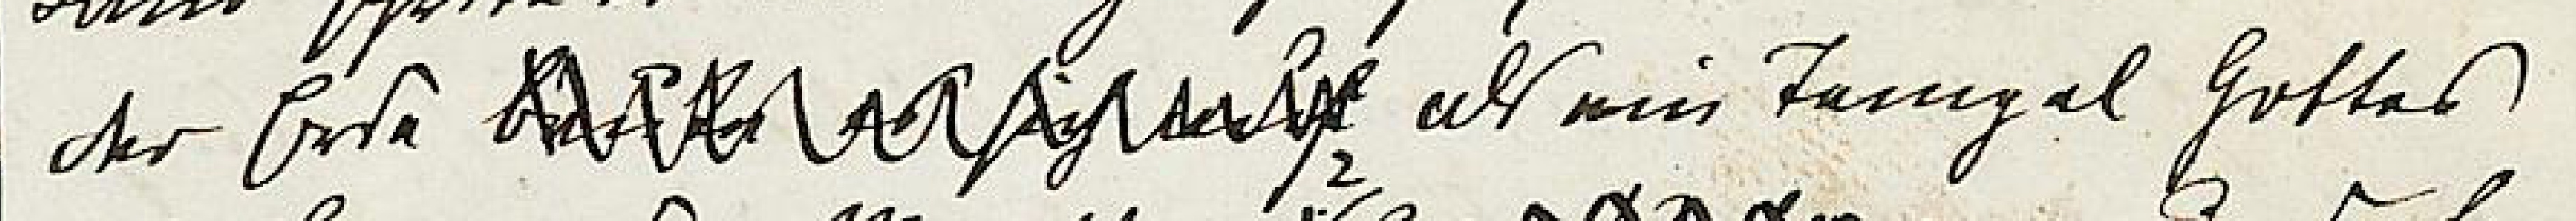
der Erde baute es sich auf als ein Tempel Gottes
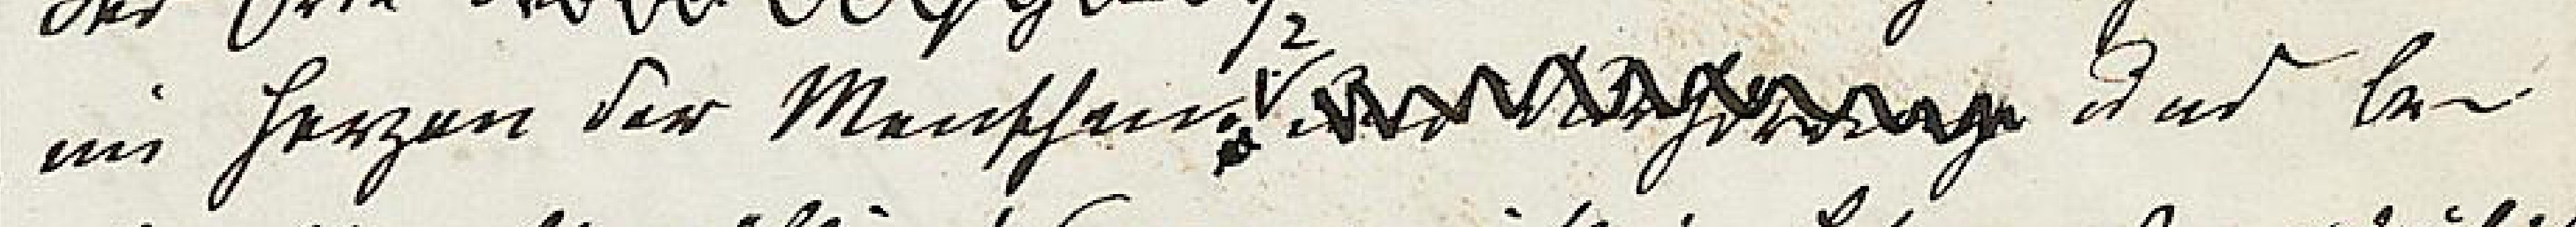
im Herzen der Menschen., V und durchdrang und be¬
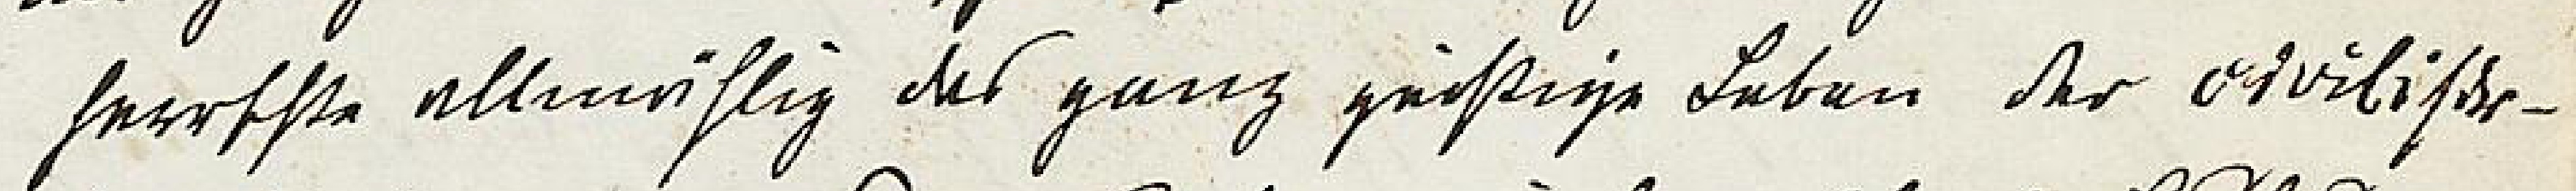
herrschte allmählig das ganz geistige Leben der civilisier¬
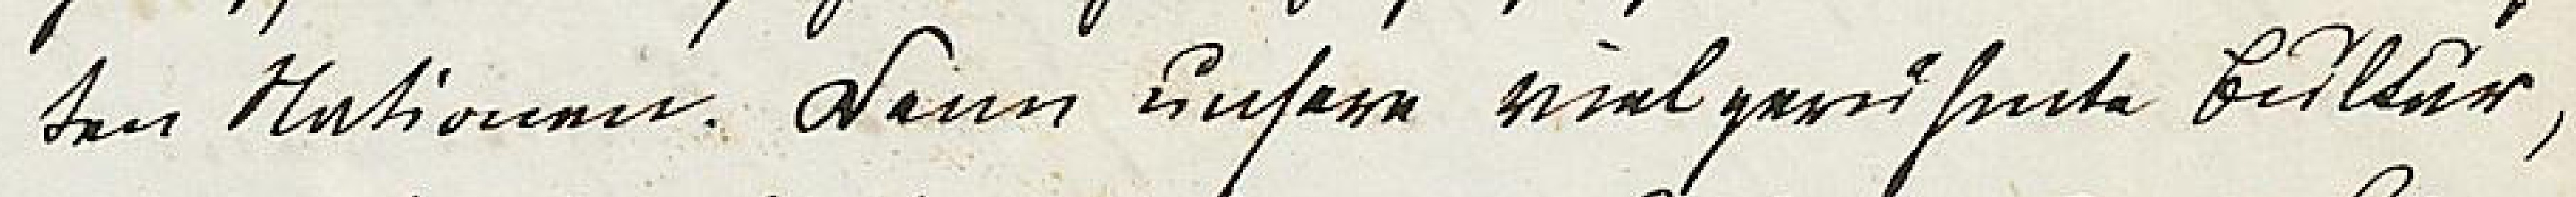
ten Nationen. Denn unsere vielgerühmte Cultur,
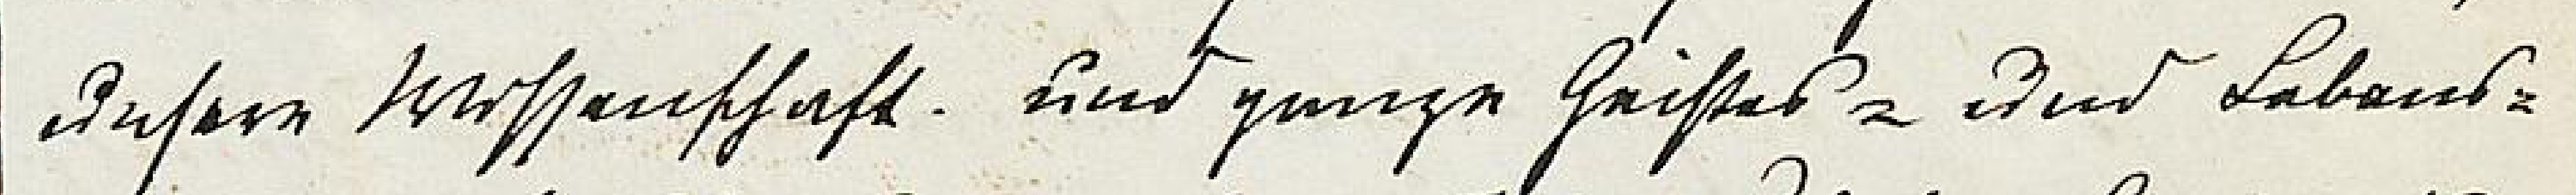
unsere Wissenschaft und ganze Geistes- und Lebens¬
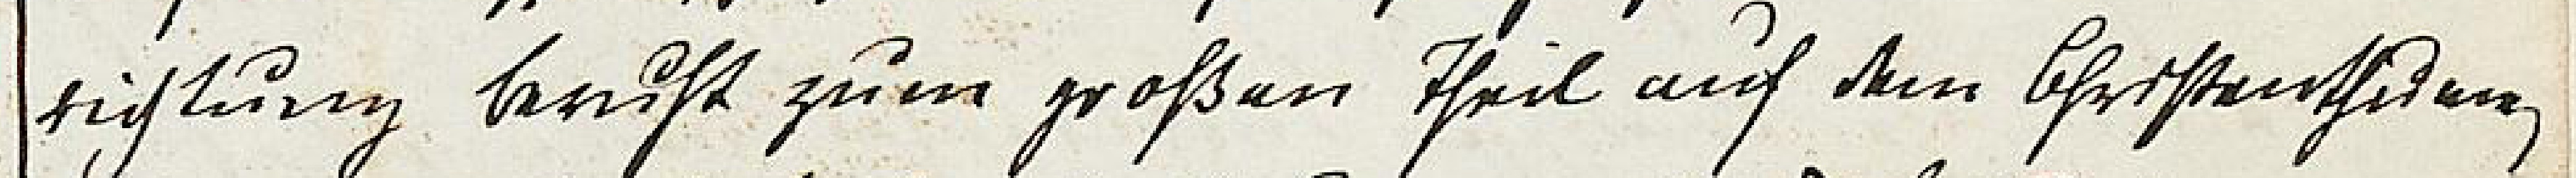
richtung beruht zum großen Theil auf dem Christenthum,
